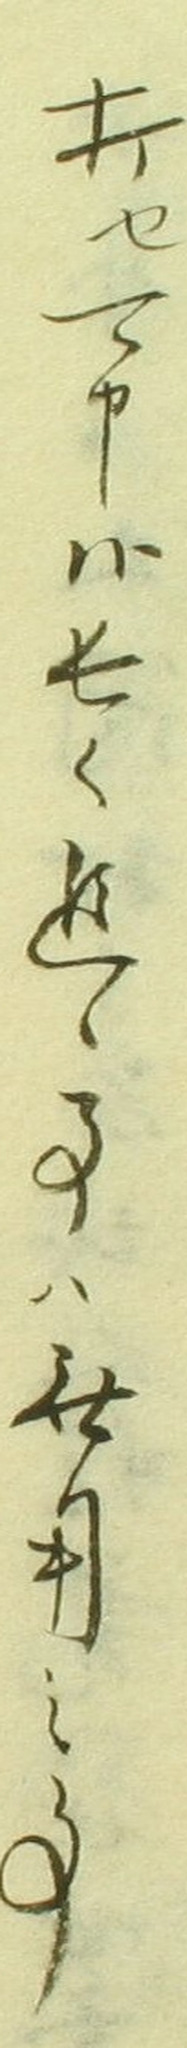打せ可申候長く追候事は無用之事
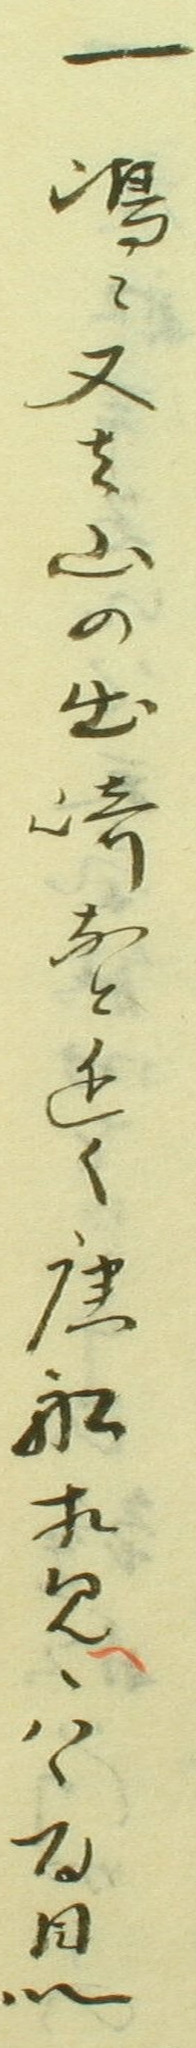一島々又は山の出崎なと近く唐船相見候はゝ百目以
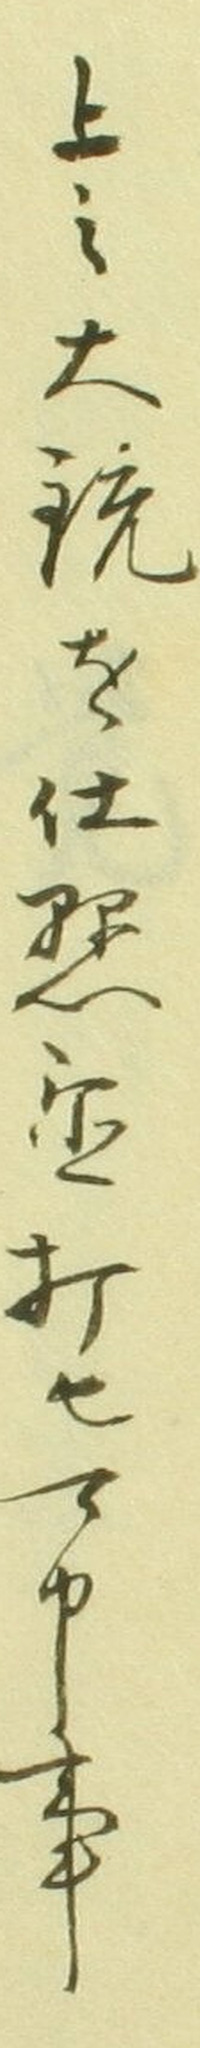上之大銃を仕懸置打せ可申事
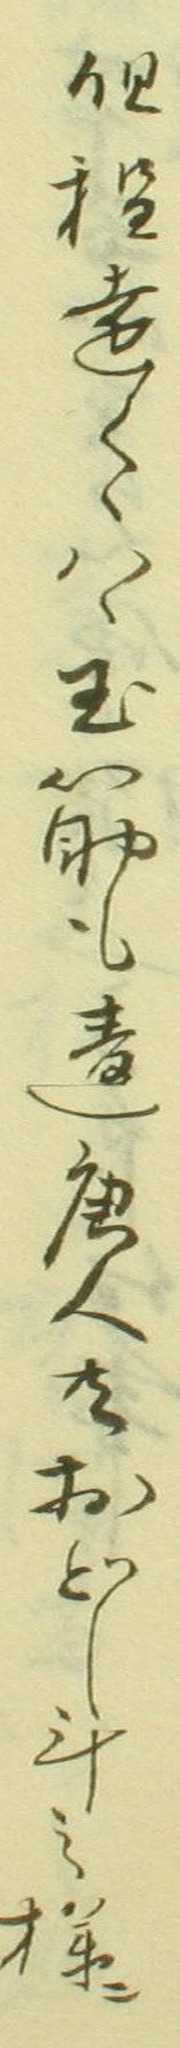但程遠く候はゝ玉筋も違唐人共おどし計之様ニ
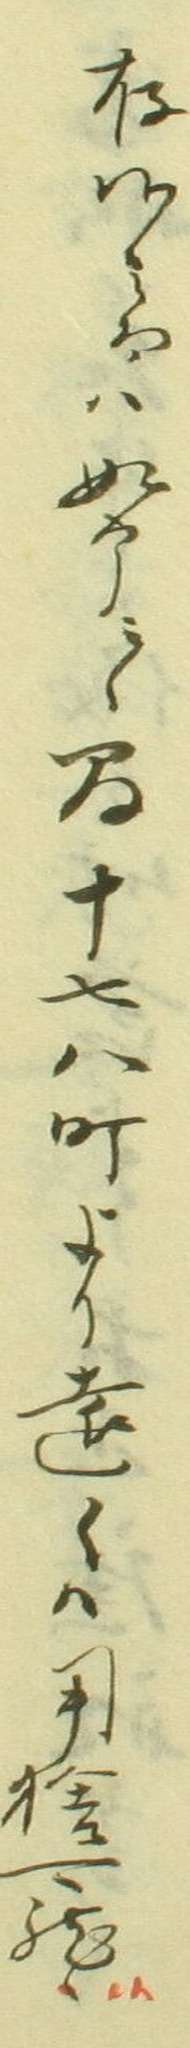存候二而は如何ニ候間十七八町より遠くは用捨可然候
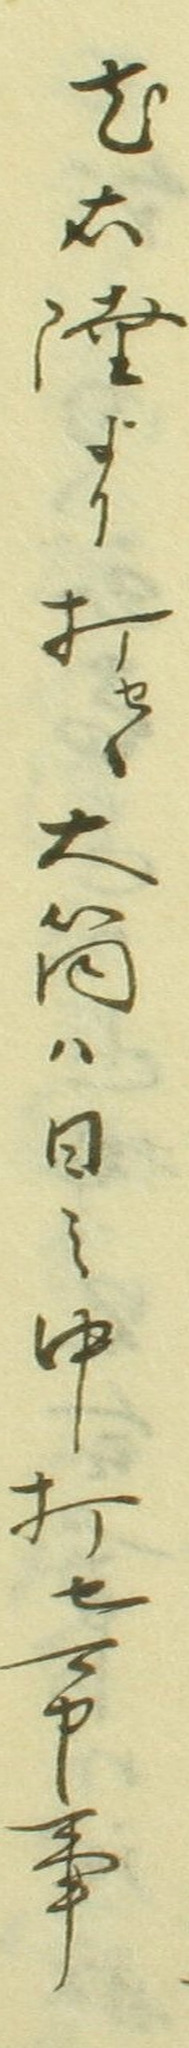尤右陸より打せも大筒は日之中打せ可申事
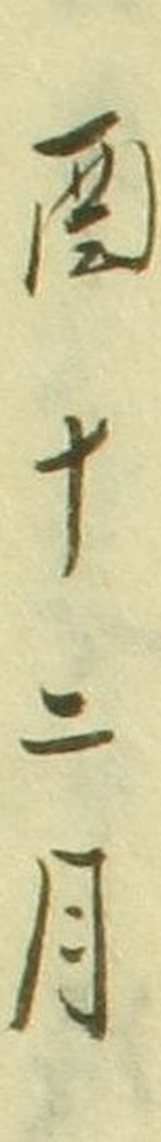酉十二月

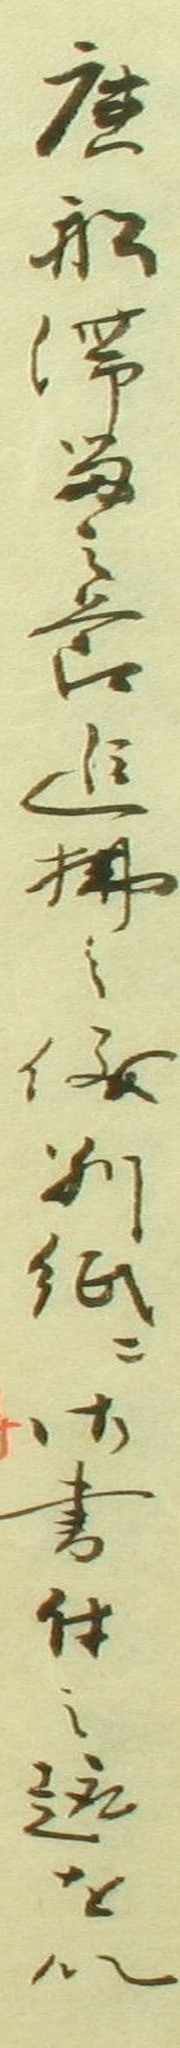唐船滞留之節追払之儀別紙ニ御書付之趣を以
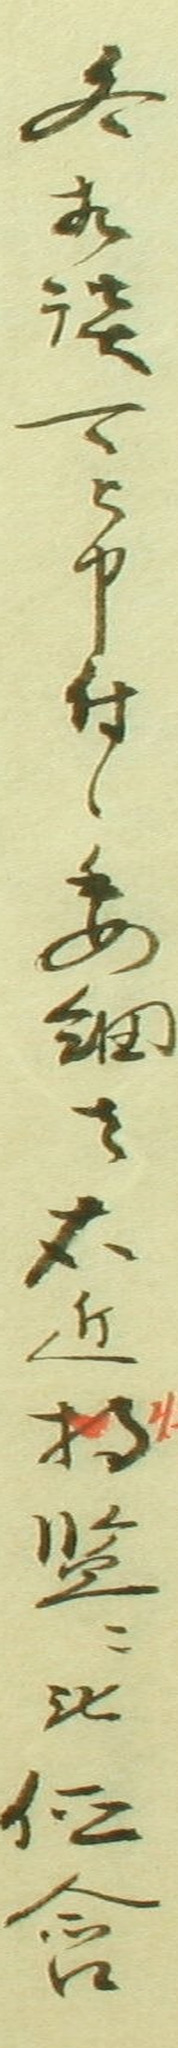各相談可被申付候委細は右近将監ニ被仰含
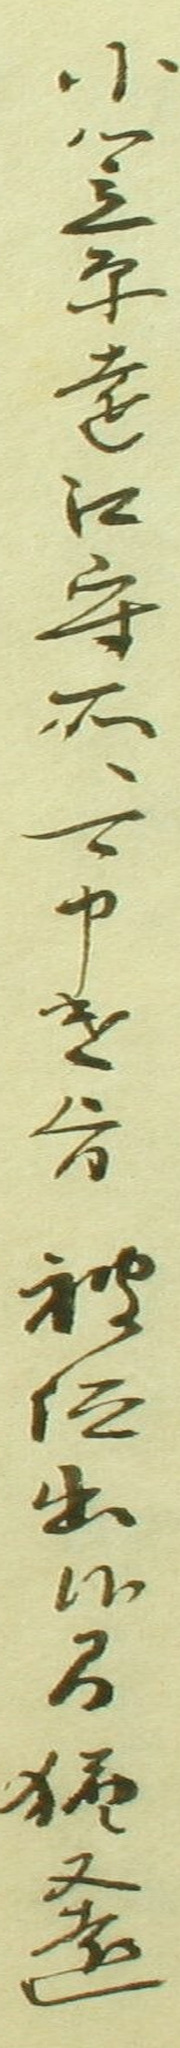小笠原遠江守所へ可申遣旨被仰出候間猶又遠
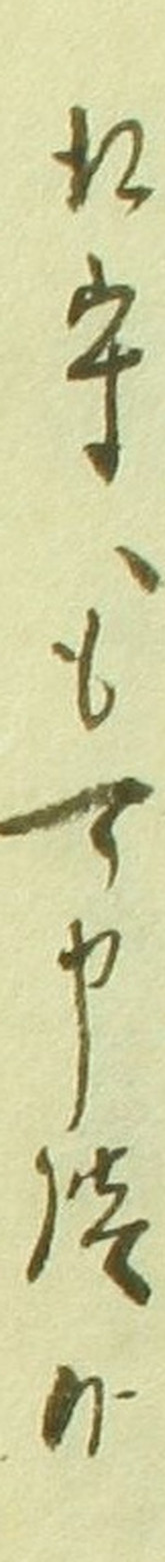江守へも可申談候
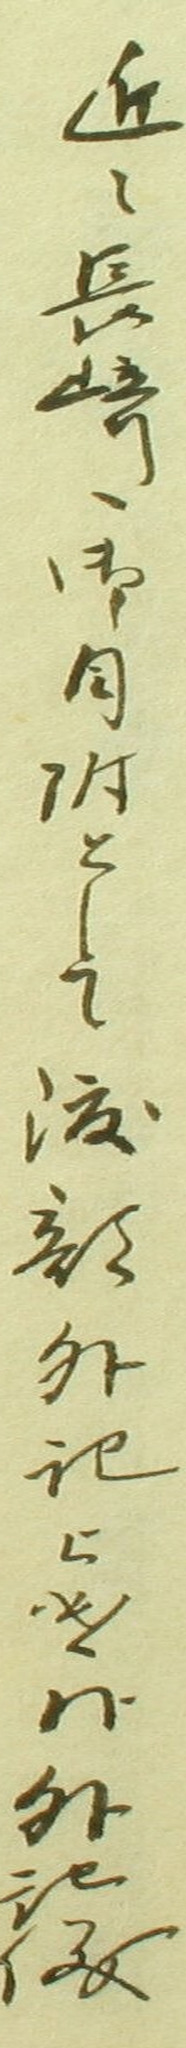近々長崎へ御用附として渡部外記被遣候外記儀
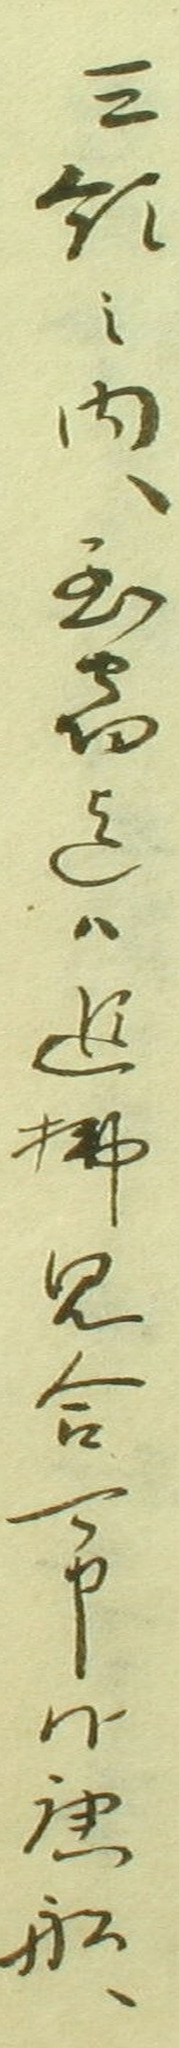三領之内へ至宿迄は追払見合可申候唐船へ
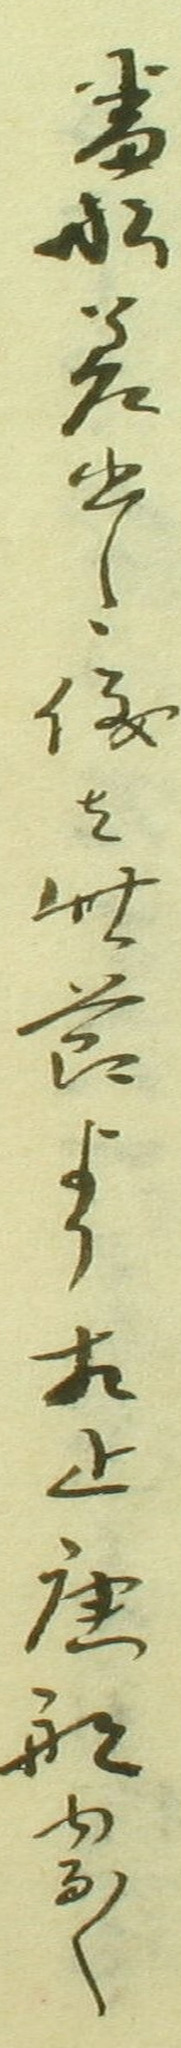番船差出し候義は無節より相止唐船ゆる〳〵
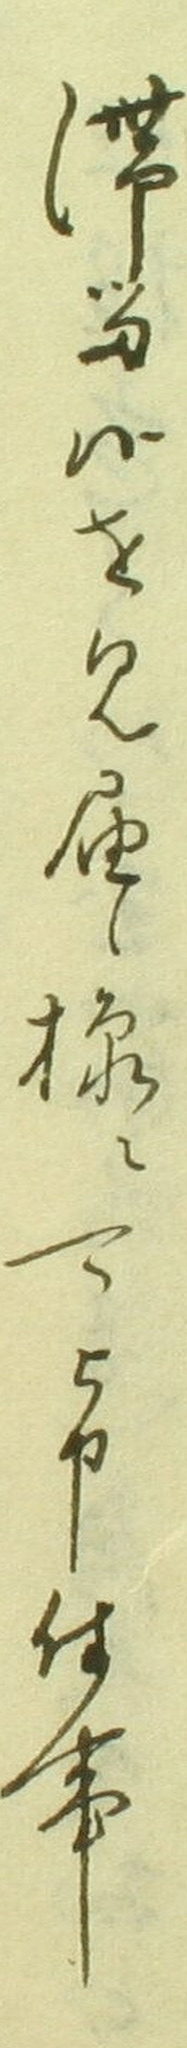滞留候を見届候様ニ可被申付事
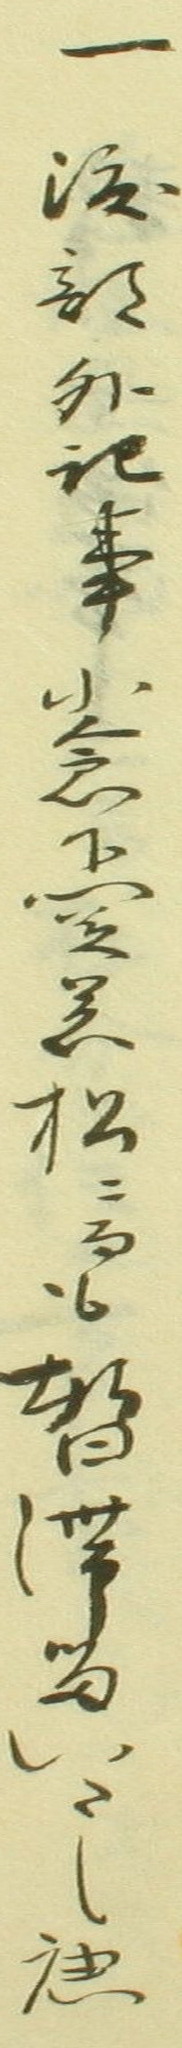一渡部外記事小倉下関若松ニ而も暫滞留いたし唐
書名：唐船漂流記 二
